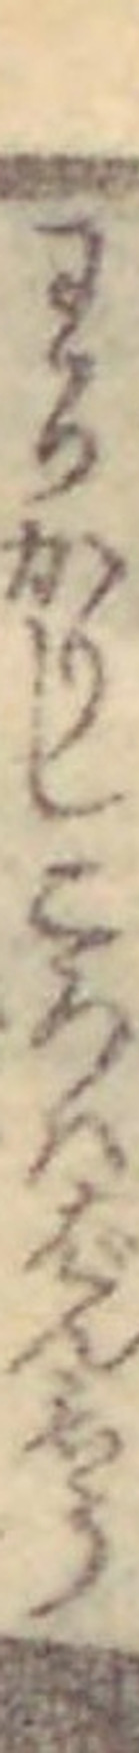わかかりしころはばんしう
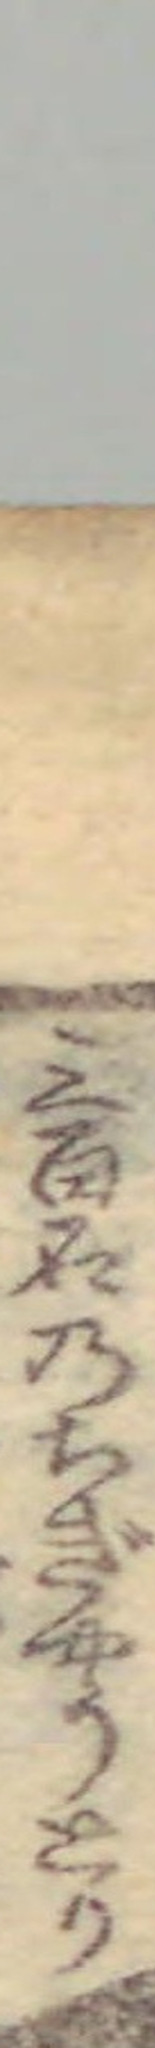三百石のちぎやうとり
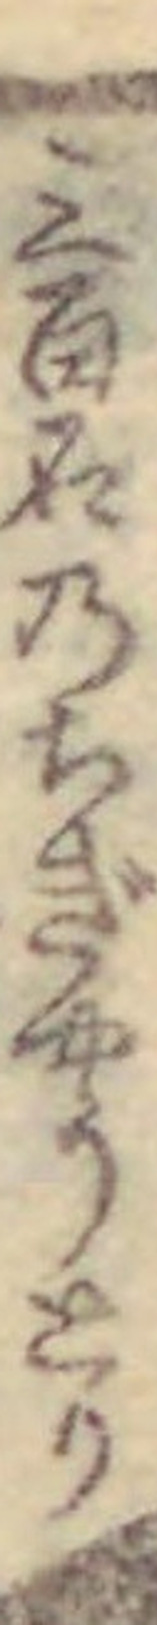三百石のちぎやうとり
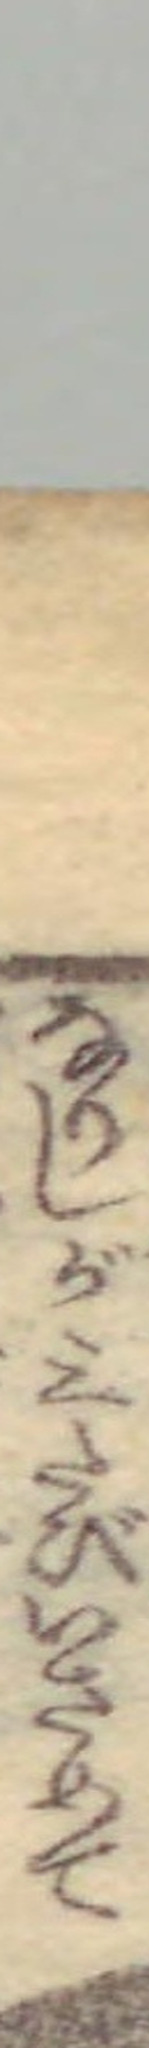なりしが三たびいさめて
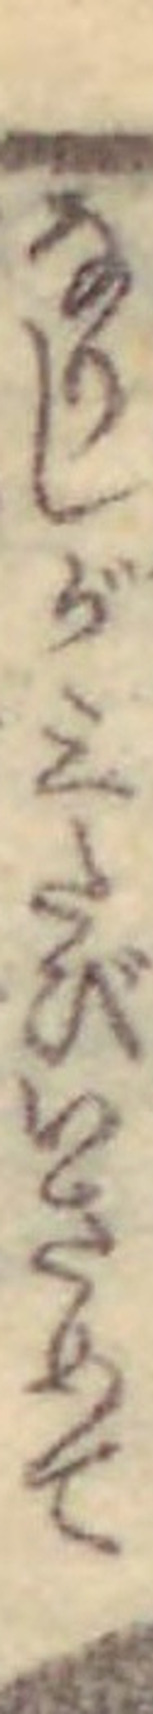なりしが三たびいさめて
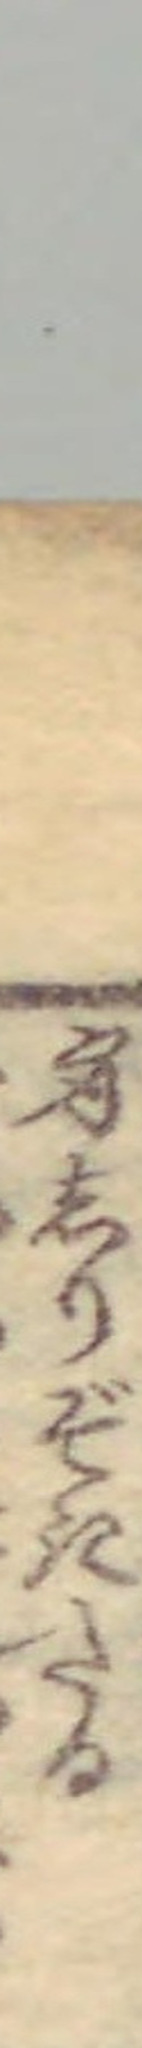身しりぞきたる
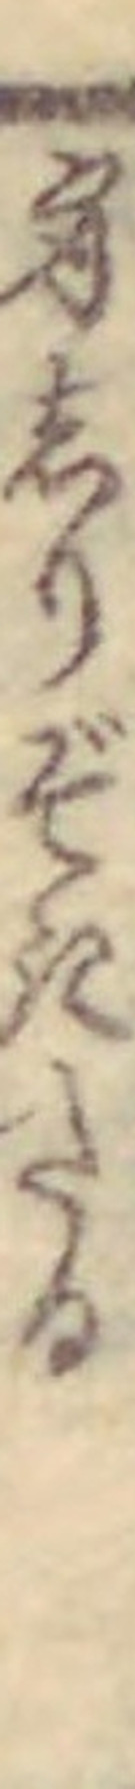身しりぞきたる
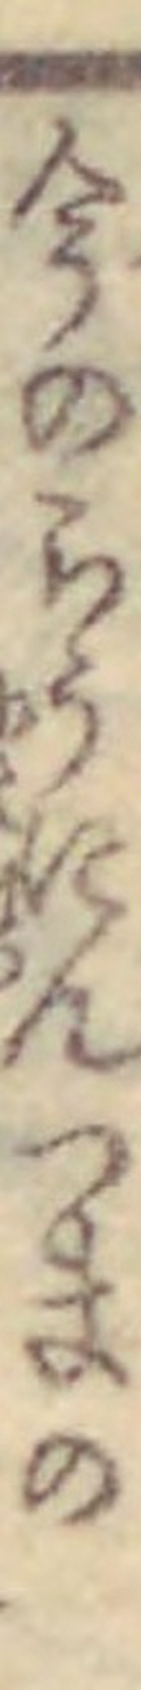今のらうにんつまの
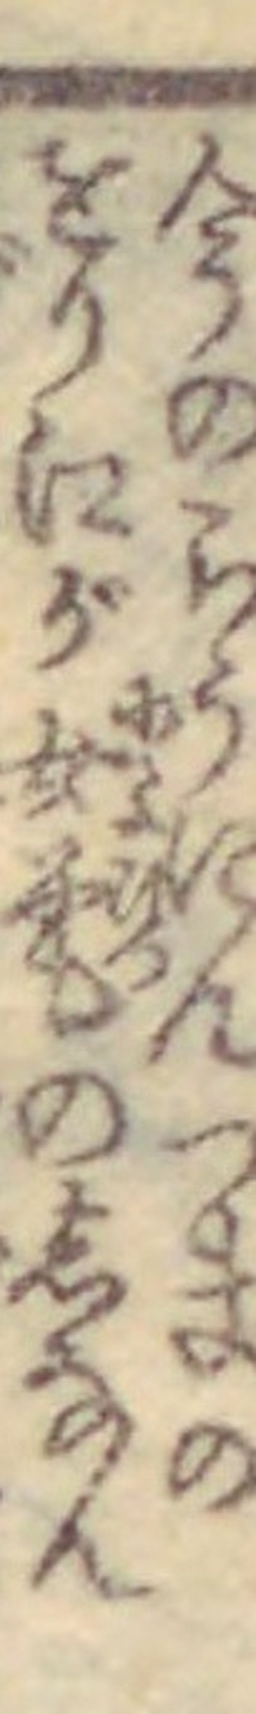をり江が女筆のしなん
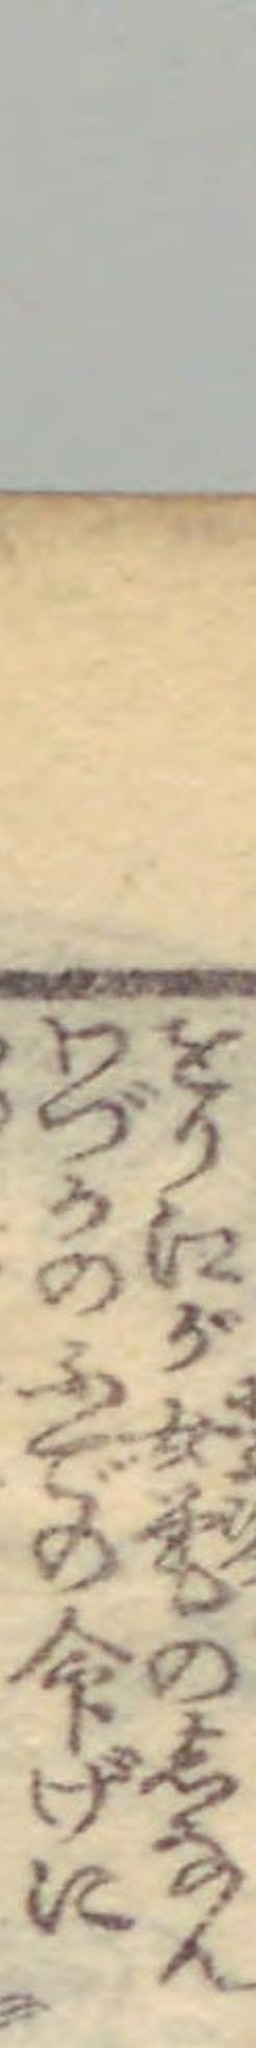わづかのふでの命げに
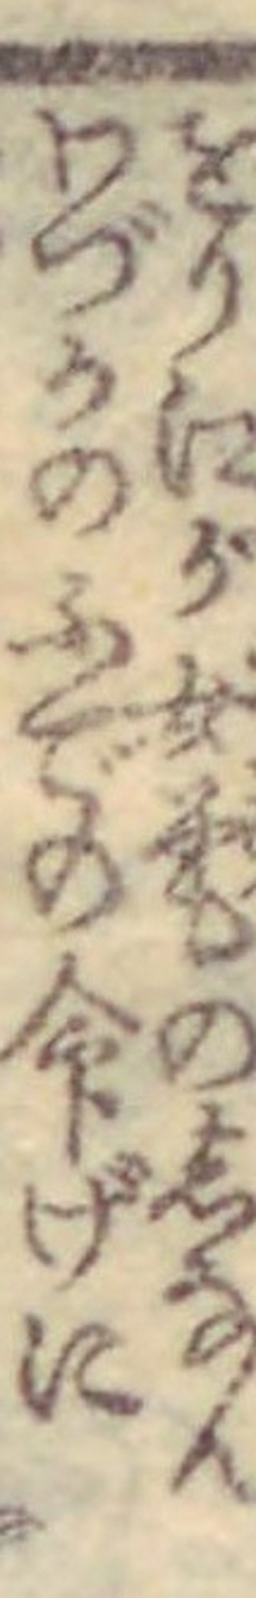わづかのふでの命げに
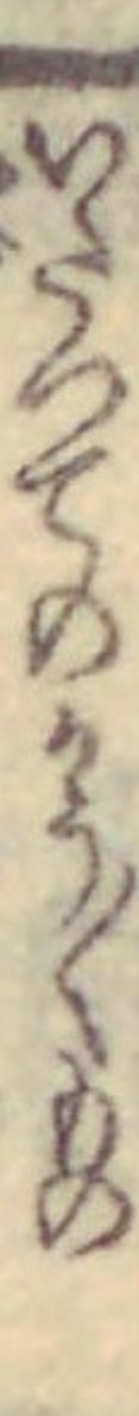いたつてのかう〳〵もの
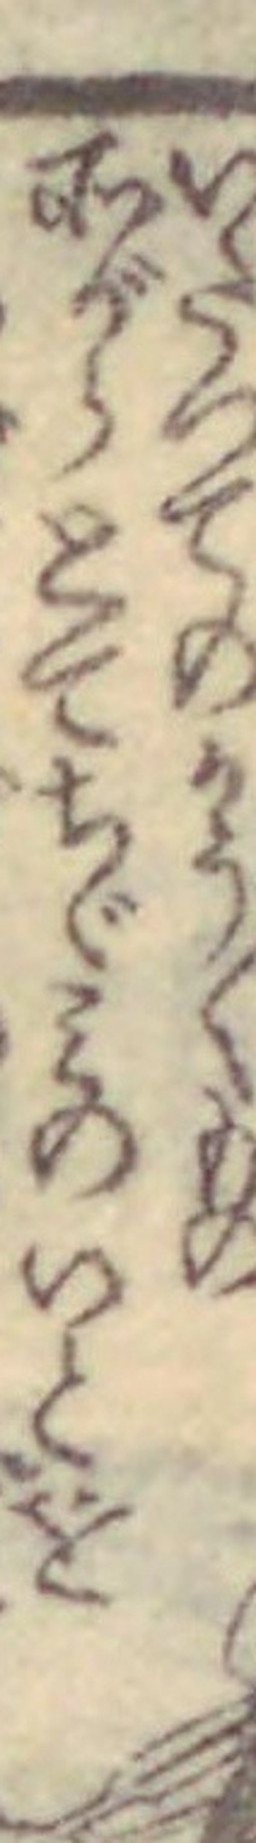所がらとてちゞみのいとを
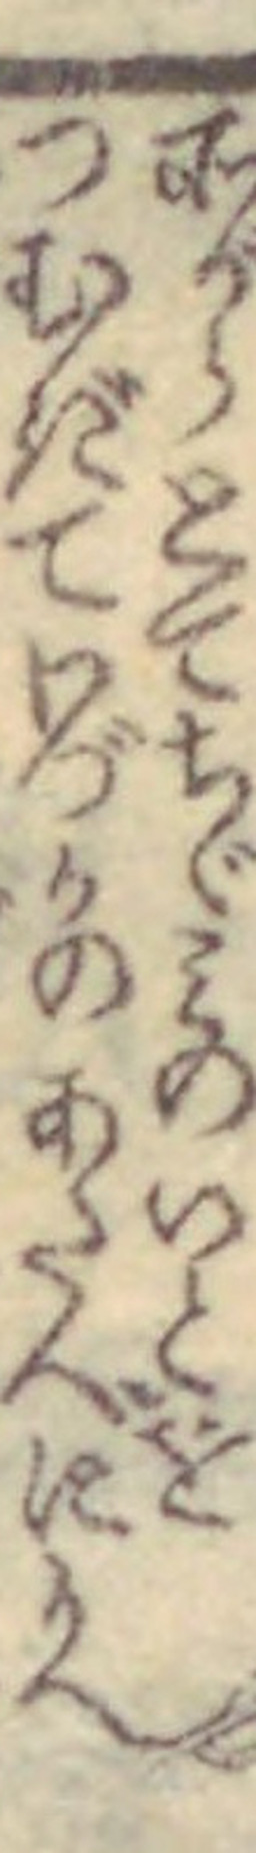つむぎてわづかのあたへにかへ
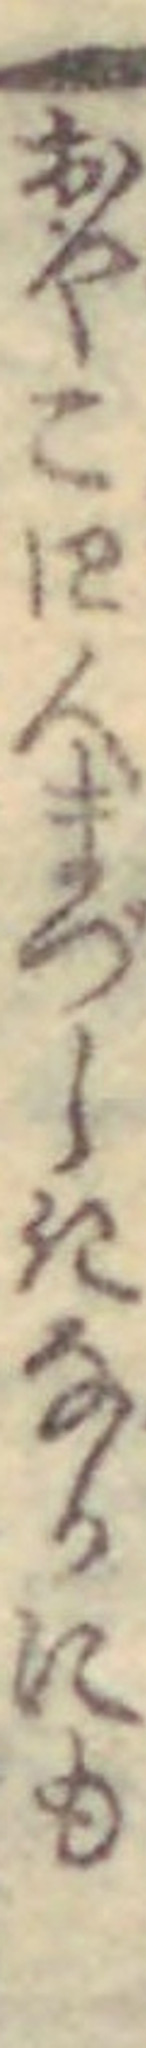おやこ四人まづしきなかにも
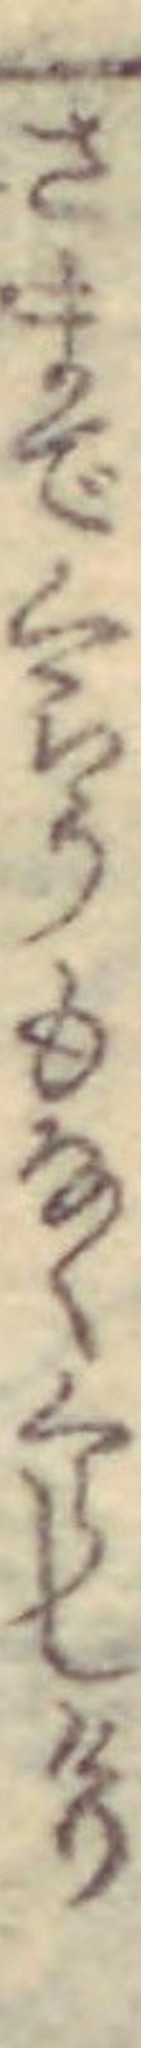さまでくらうもなくくらしけり
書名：八ツ目鱣因縁物語 3巻
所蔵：国立国会図書館 National Diet Library, JAPAN
